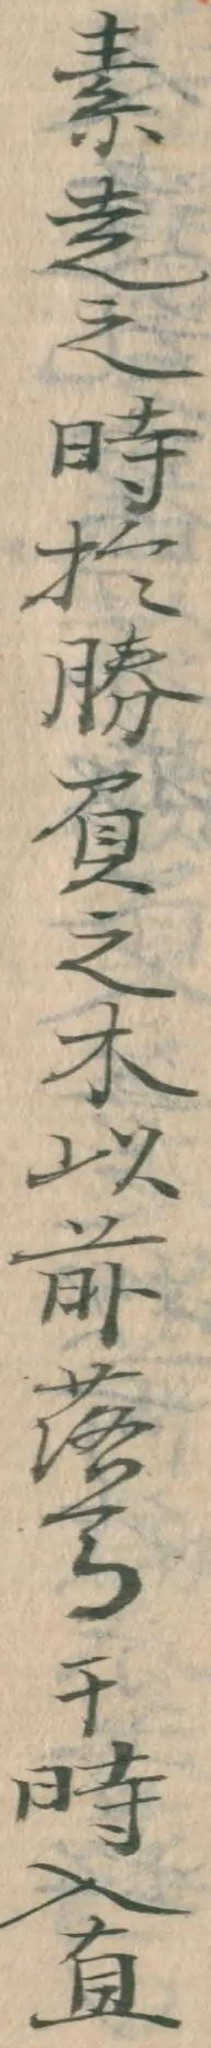素走之時於勝負之木以前落馬于時入直
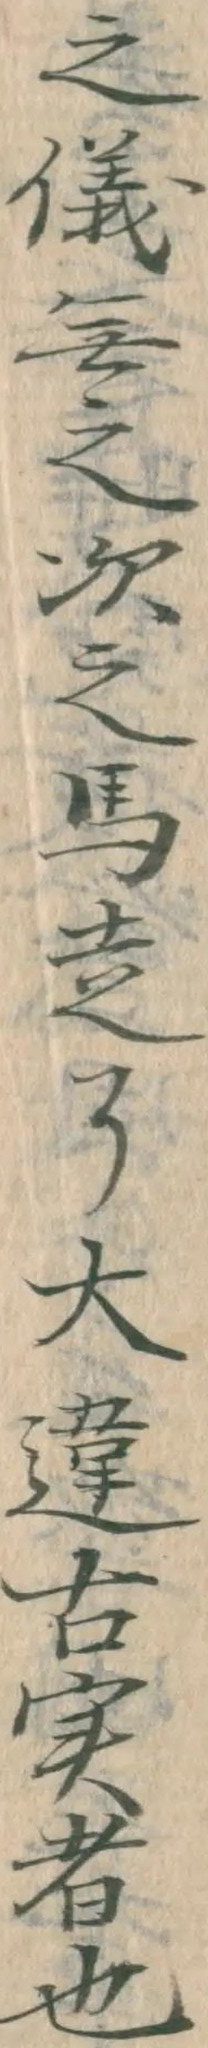之儀無之次之馬走了大違古実者也
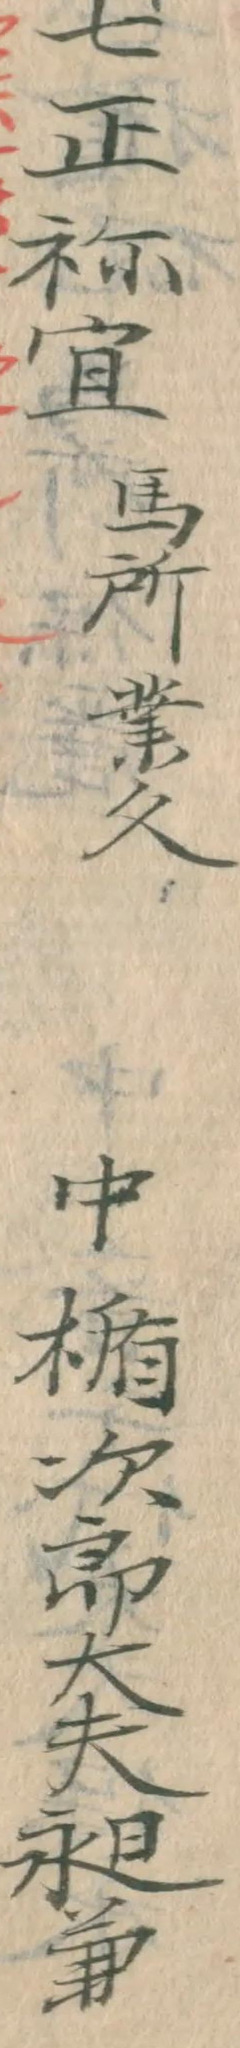七正祢宜馬所業久中楯次郎大夫昶兼
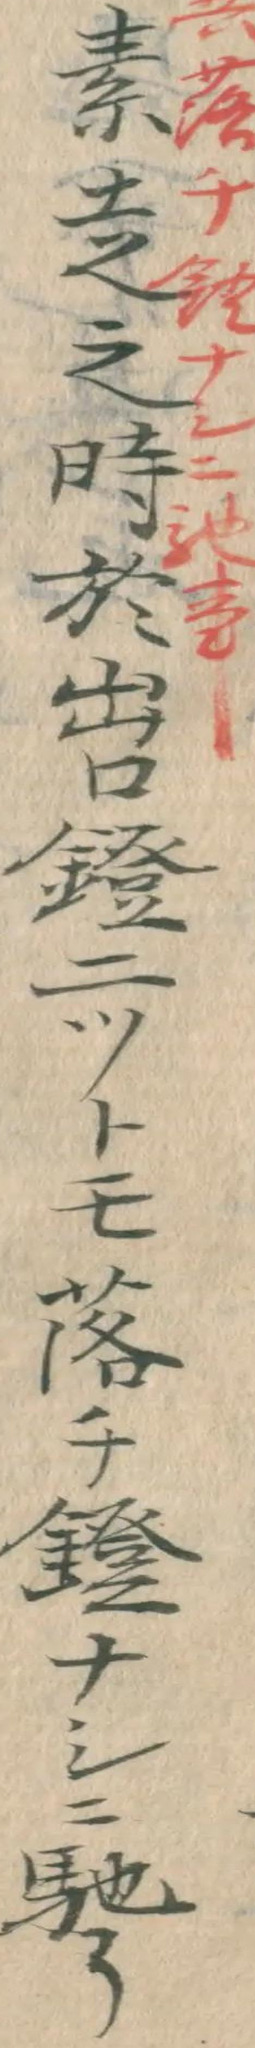素走之時於出口鐙二ツトモ落チ鐙ナシニ馳了
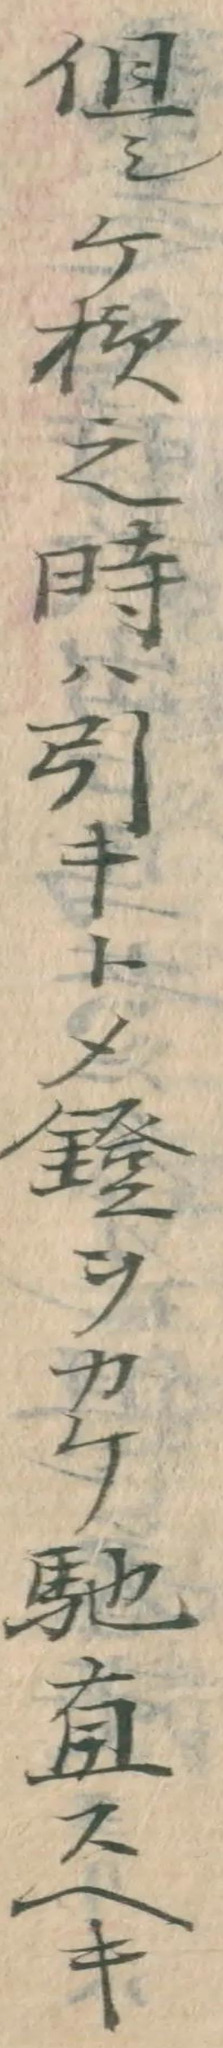但シケ様之時ハ引キトメ鐙ヲカケ馳直スヘキ

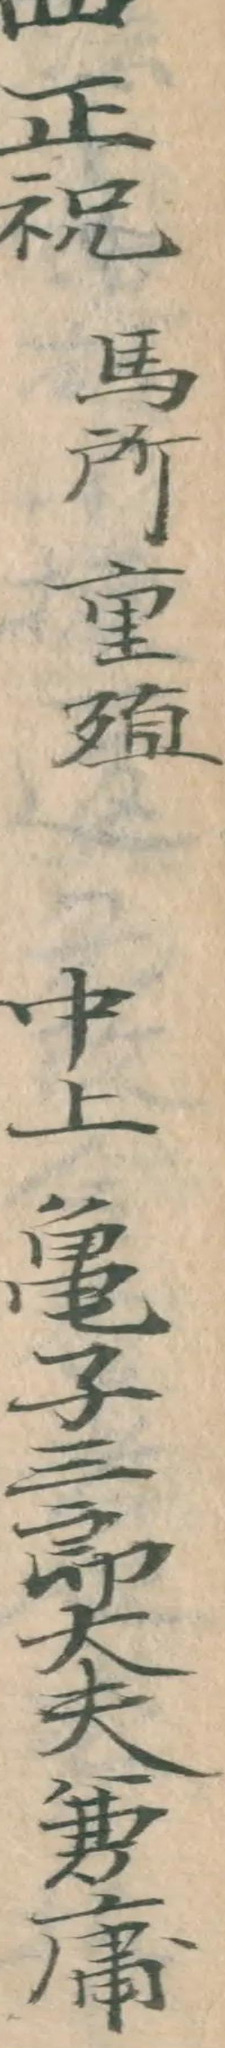四正祝馬所重殖中上亀子三郎大夫勇庸
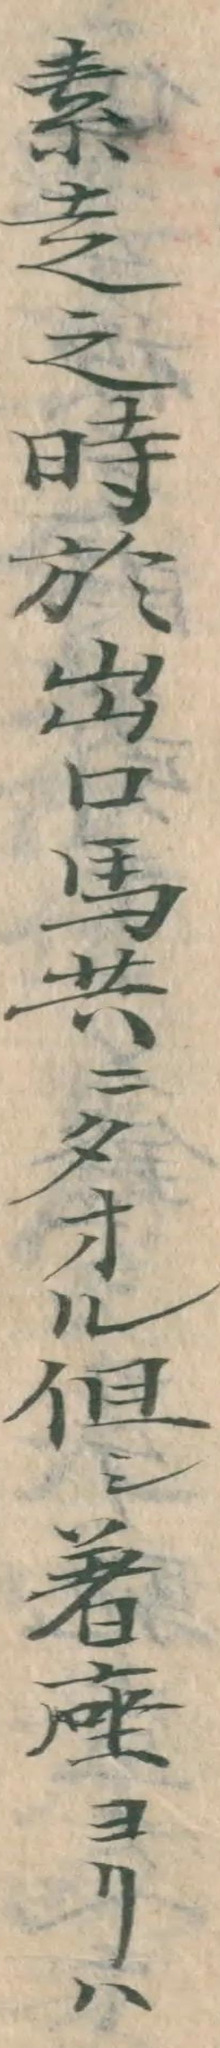素走之時於出口馬共ニタオル但シ着座ヨリハ
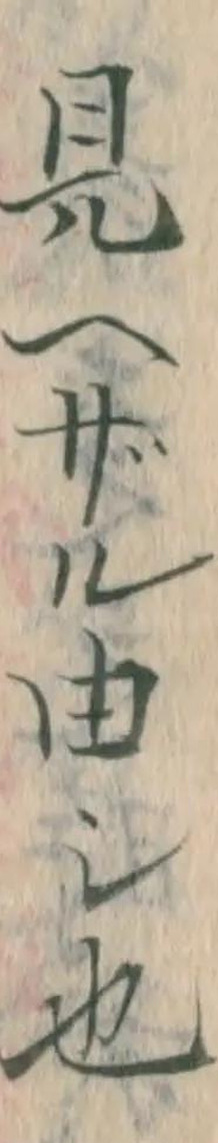見ヘザル由シ也
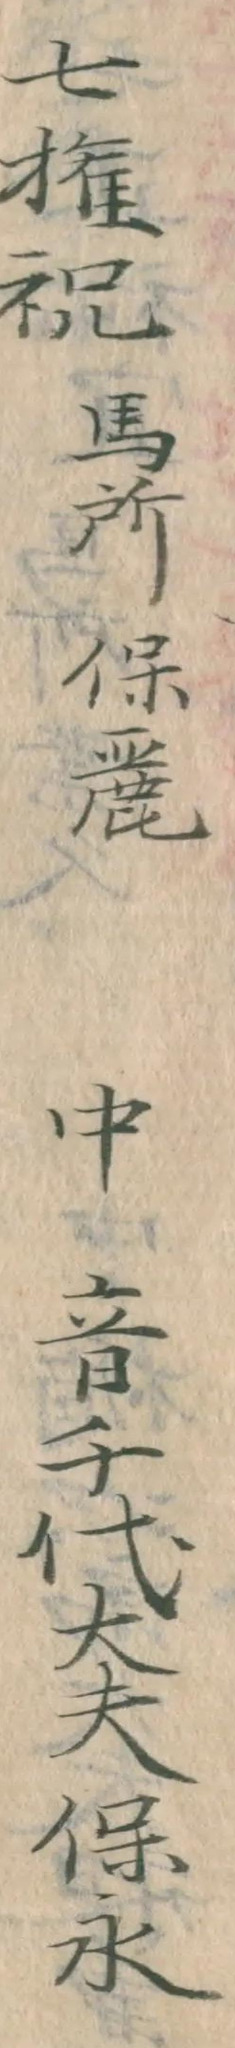七権祝馬所保麗中音千代大夫保永
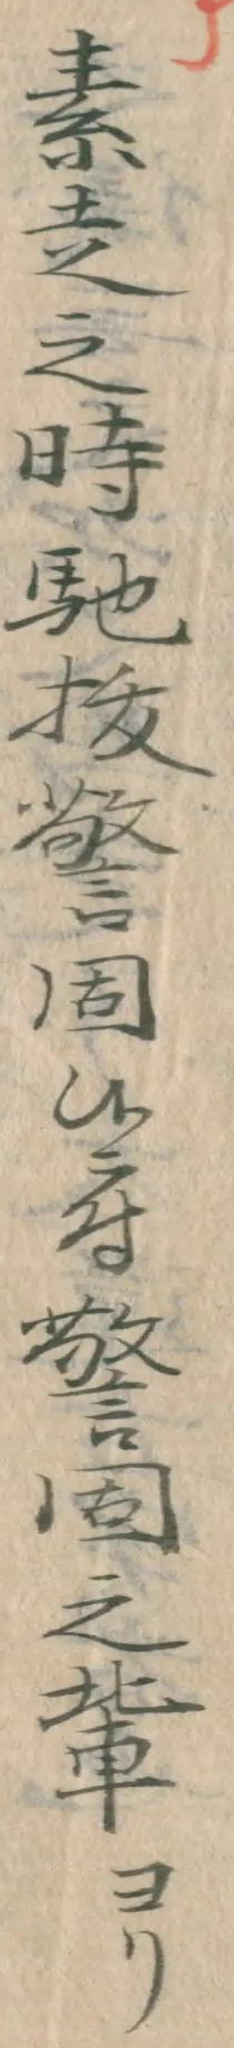素走之時馳抜警固候ニ付警固之輩ヨリ
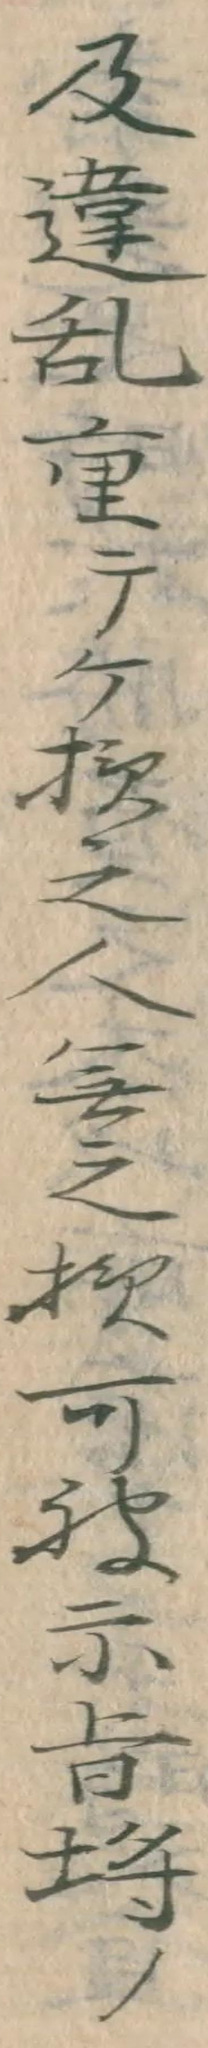及違乱重テケ様之人無之様可被示旨埒ノ
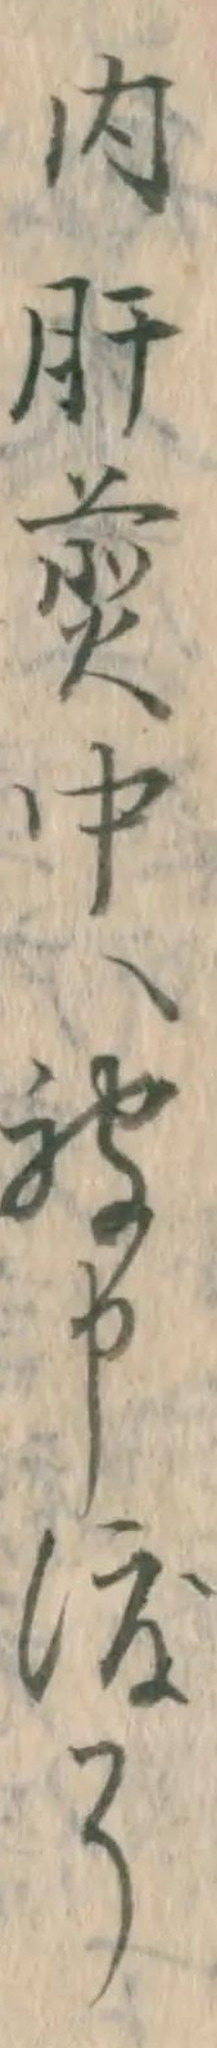内肝煎中へ被申渡了
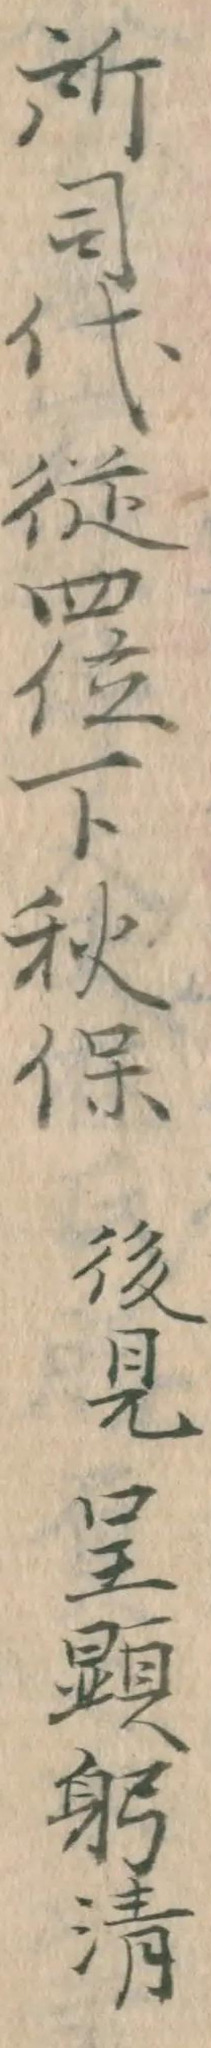所司代従四位下秋保後見呈顕躬清
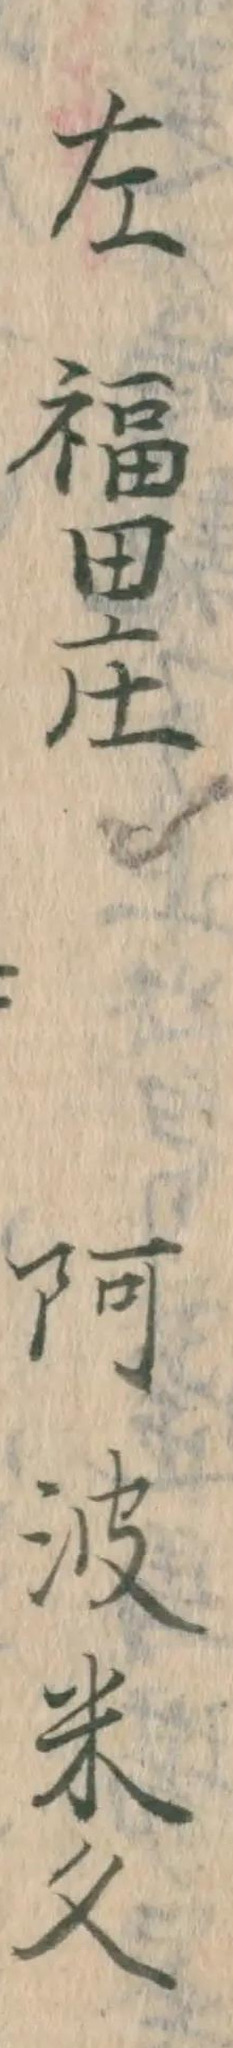左福田庄阿波米久
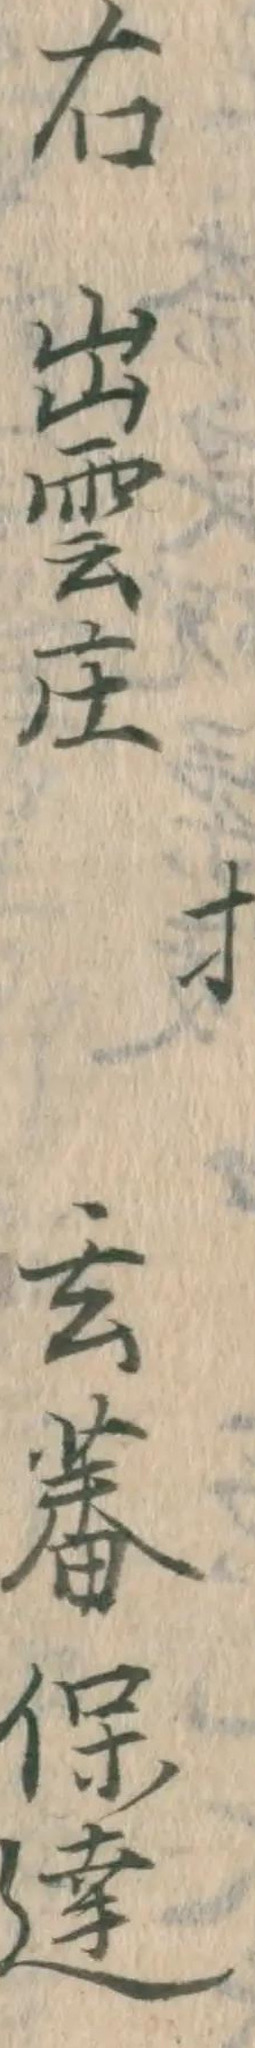右出雲庄玄蕃保達
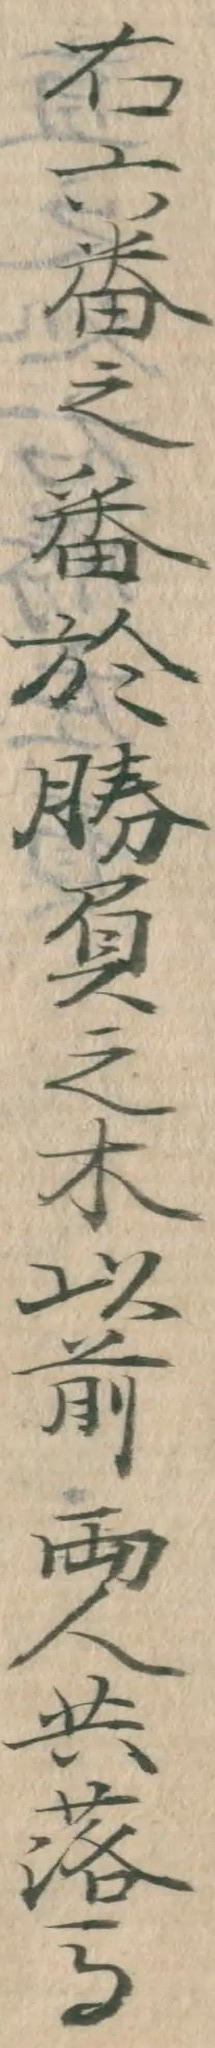右六番之番於勝負之木以前両人共落馬
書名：賀茂社記録. 第10冊
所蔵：国立国会図書館 National Diet Library, JAPAN
